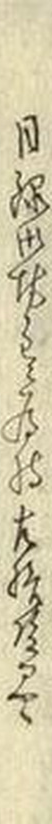目録御坊主ニ為持左膳殿部屋へ
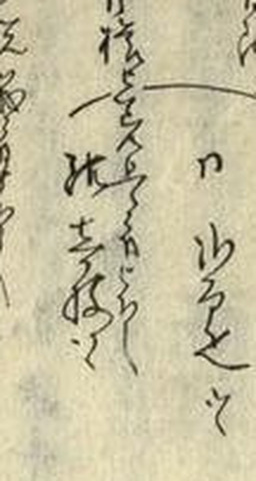御祝儀ニ付被下之
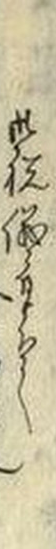御祝儀ニ付被下之
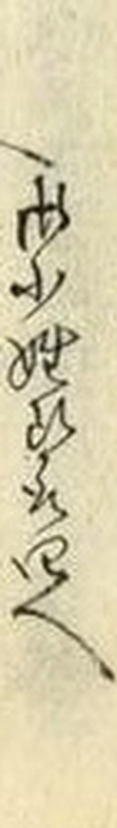御近習番頭取四人
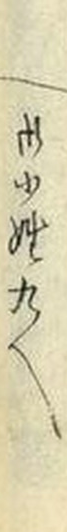御小姓九人
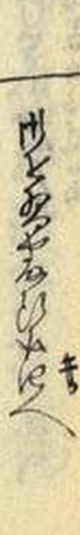御近習番頭取四人
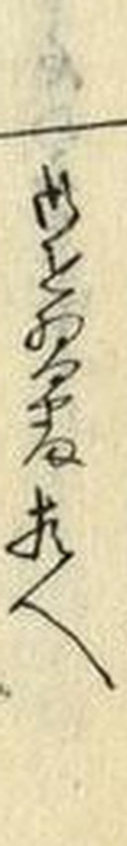御近習番拾人
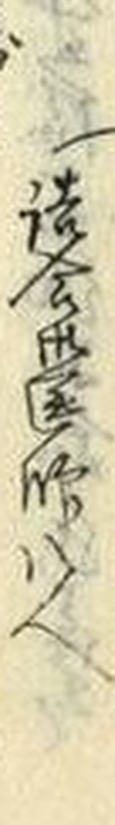詰合御医師八人
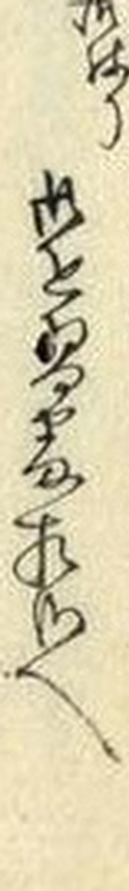御近習番拾人
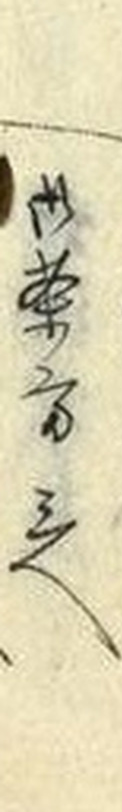御茶方三人
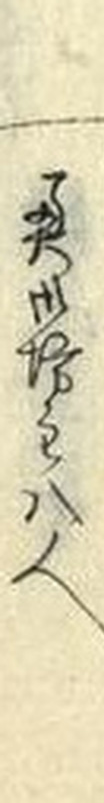奥御坊主八人
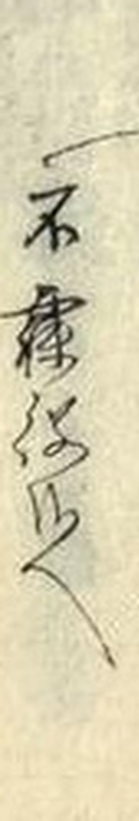不寝役弐人
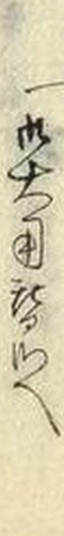御大用替弐人
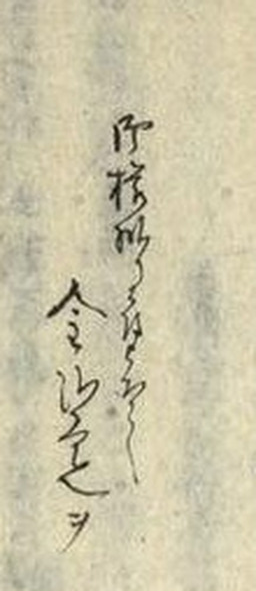御櫛掛りニ付被下之
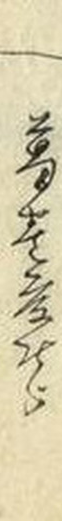葛巻藤次郎
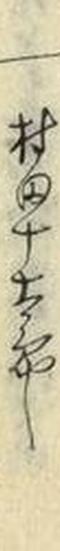村田十太郎
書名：少傅日録抄（斉善付側向頭取日記、在府）
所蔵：福井県文書館 Fukui Prefectural Archives
